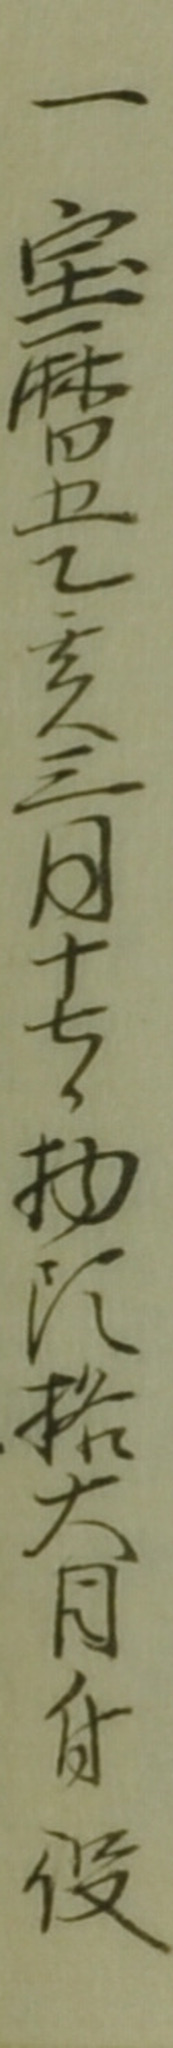一宝暦五乙亥三月十七日物頭格大目付役
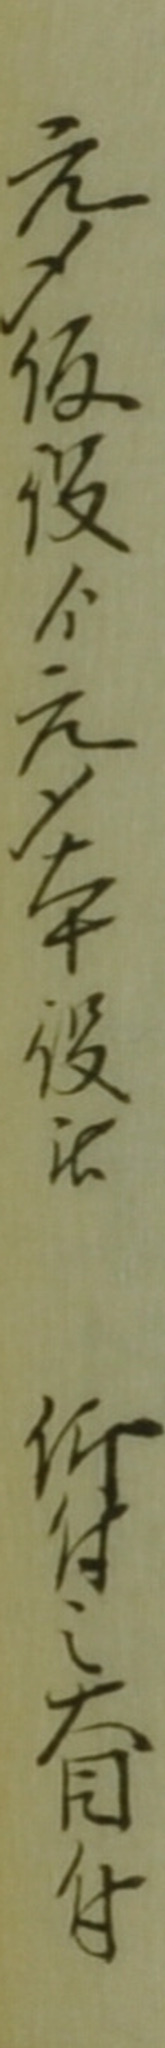元〆仮役ゟ元〆本役被仰付之大目付
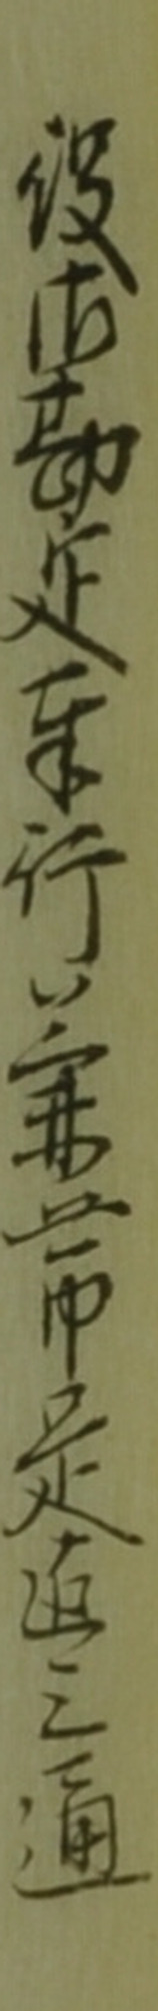役御勘定奉行兼帯是迄之通
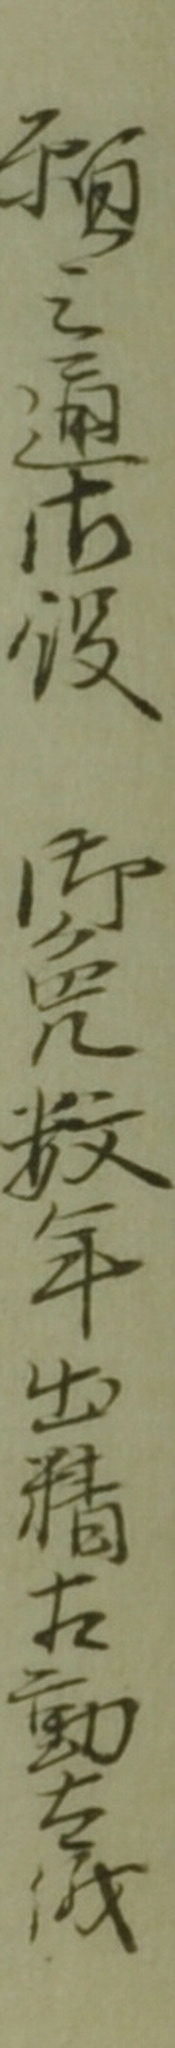願之通御役御免数年出精相勤大儀
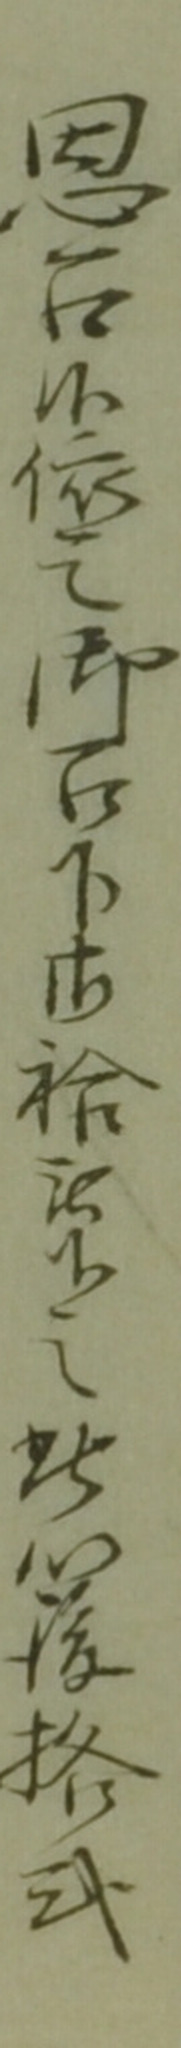思召候依之御召下御給被下之此心得格式
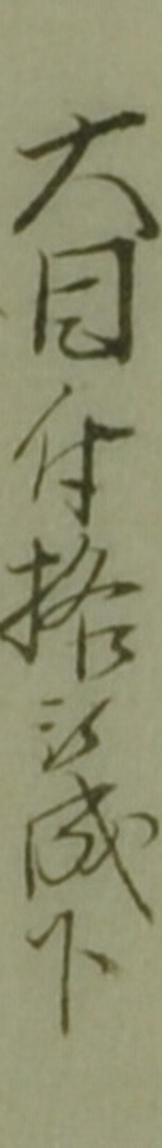大目付格被成下
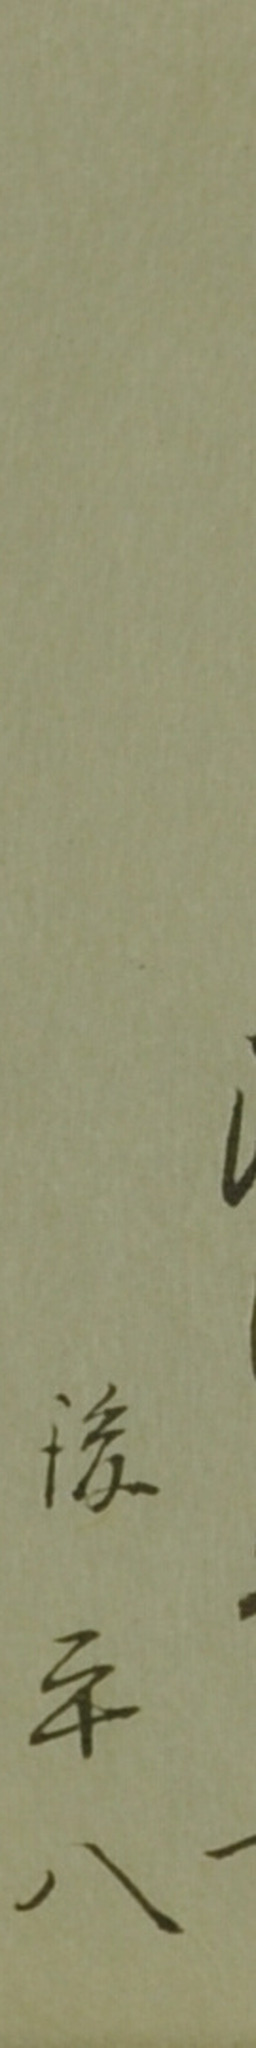後平八
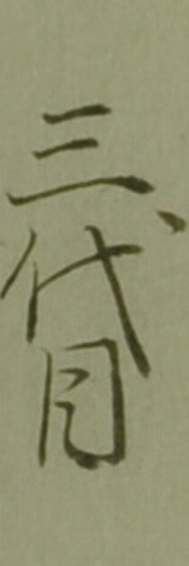三代目
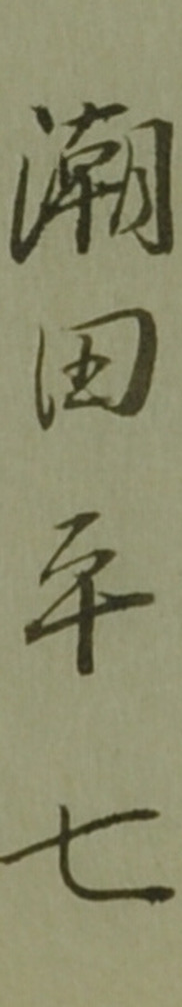潮田平七
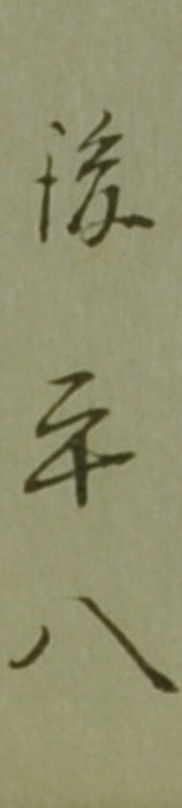後平八
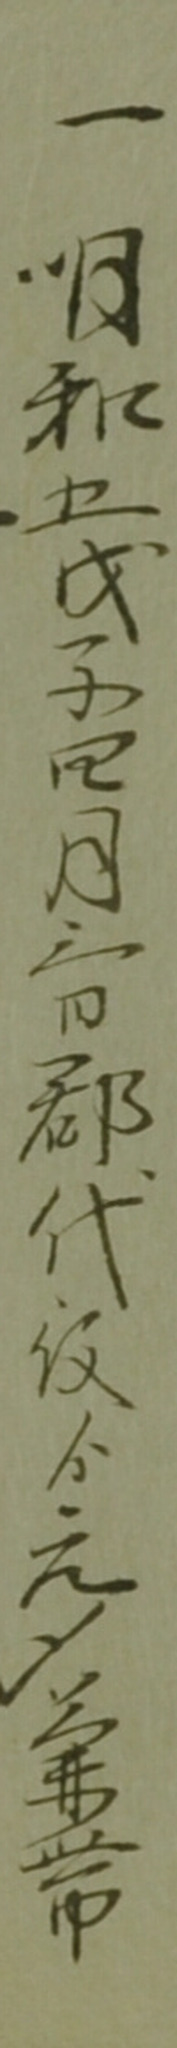一明和五戊子四月三日郡代役ゟ元〆兼帯
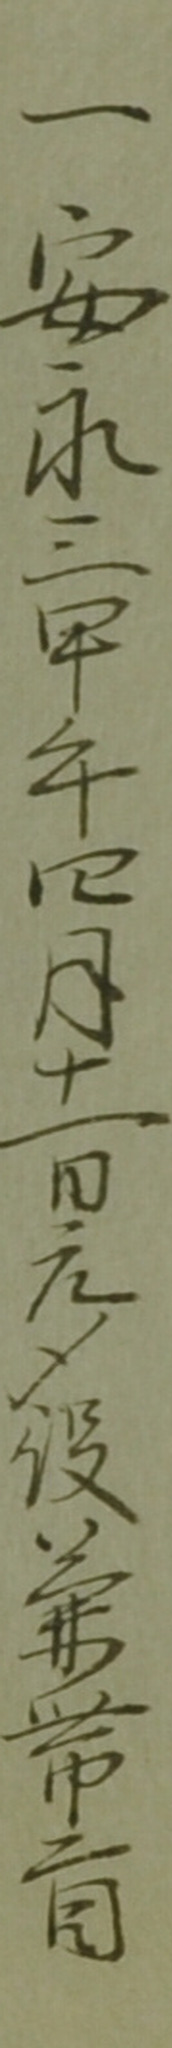一安永三甲午四月十一日元〆役兼帯首
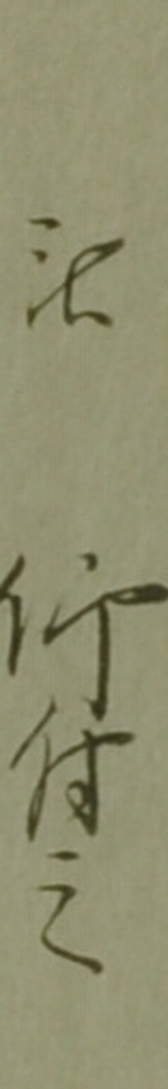被仰付之
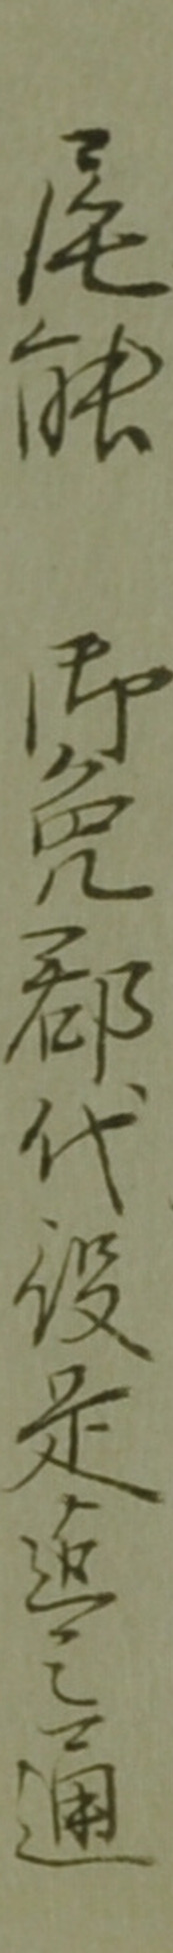尾能御免郡代役是迄之通
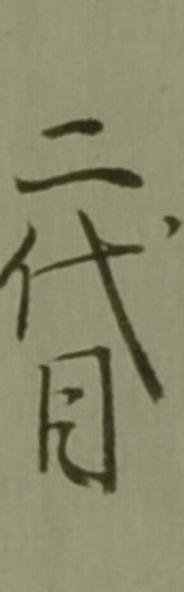二代目
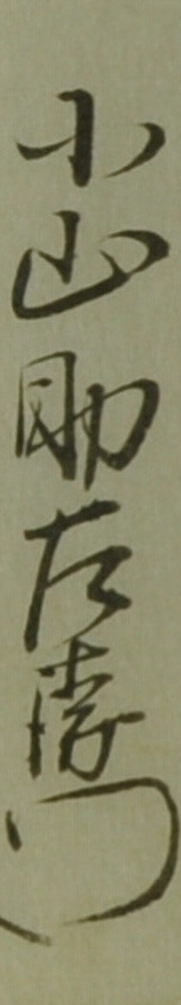小山助左衛門
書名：諸御役代々録（七）
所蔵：伊那市立高遠町図書館・合同会社AMANE
